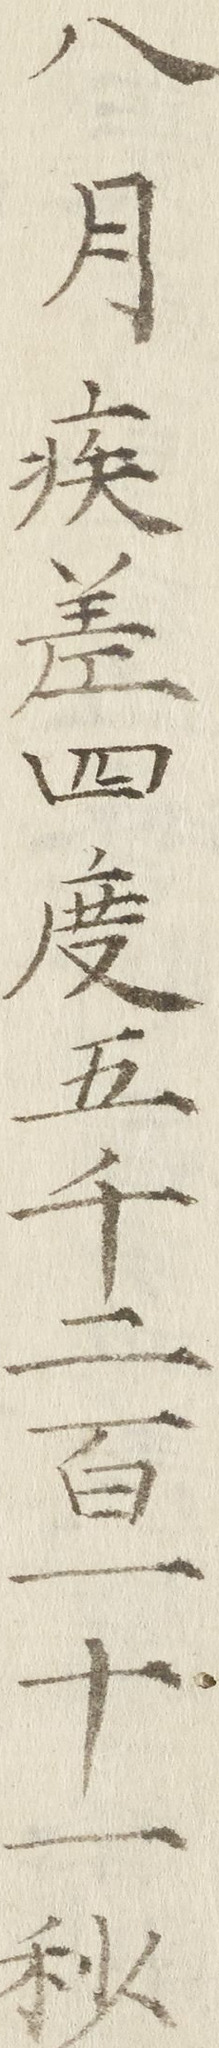八月疾差四度五千二百一十一秒
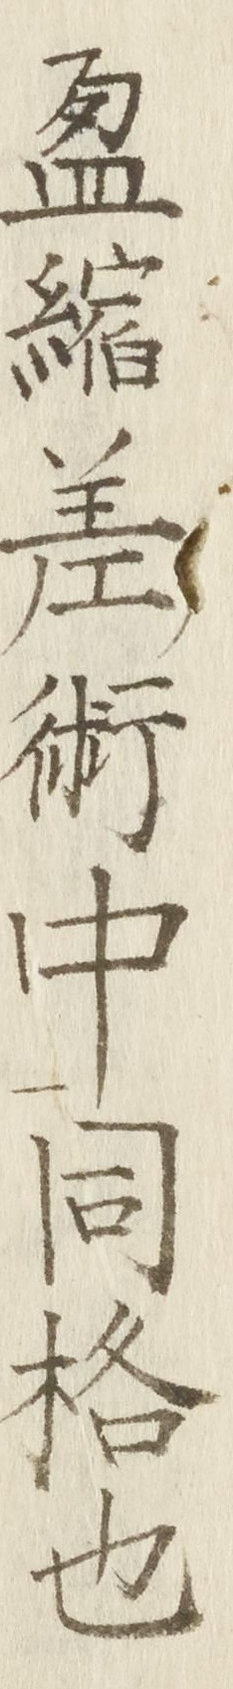盈縮差術中同格也
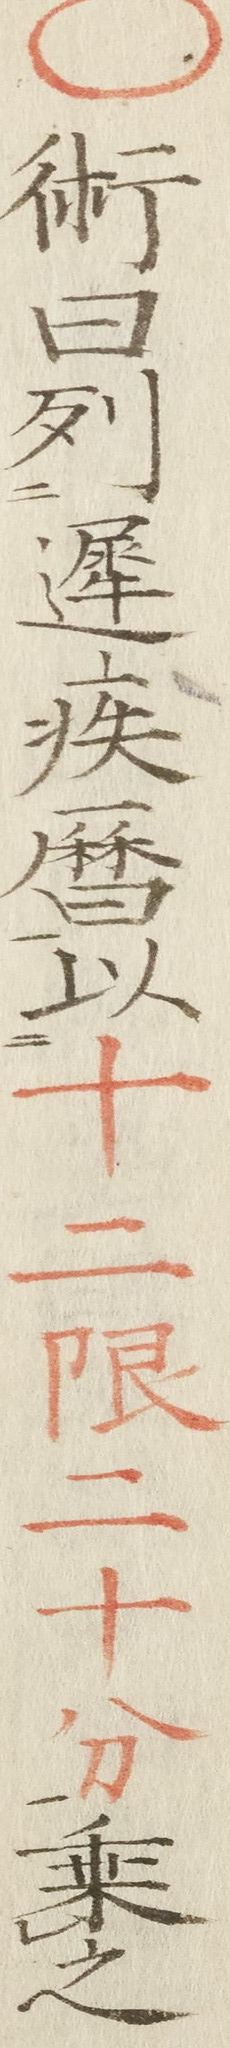○術曰列ニ遅疾暦以ニ十二限二十分乗之
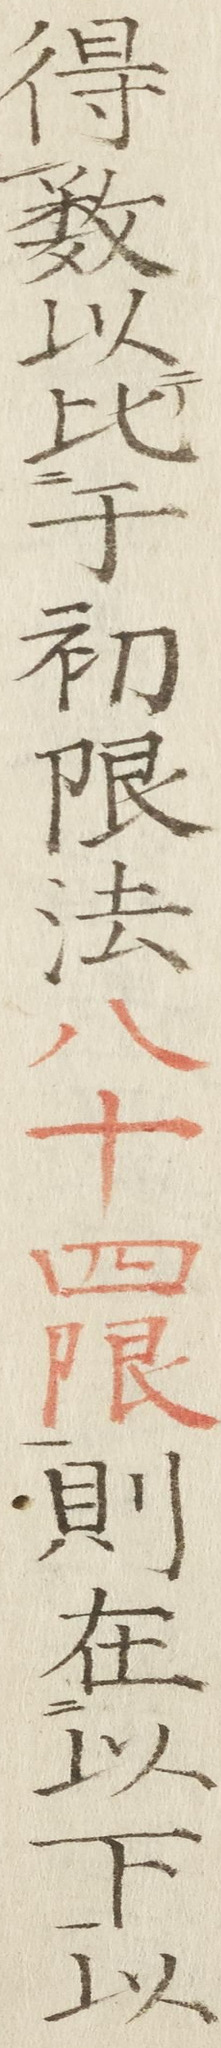得数以比ニ于初限法八十四限則在ニ以下以
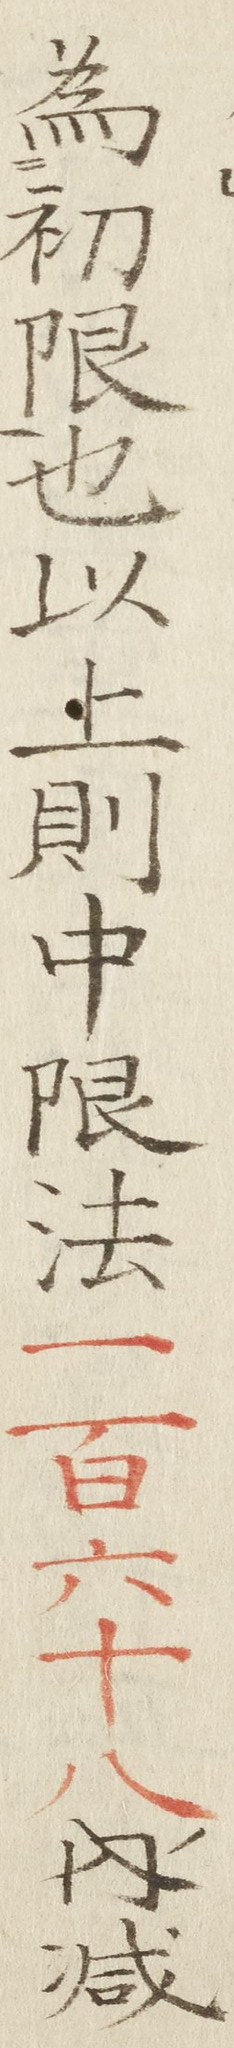為ニ初限也以上則中限法一百六十八内減
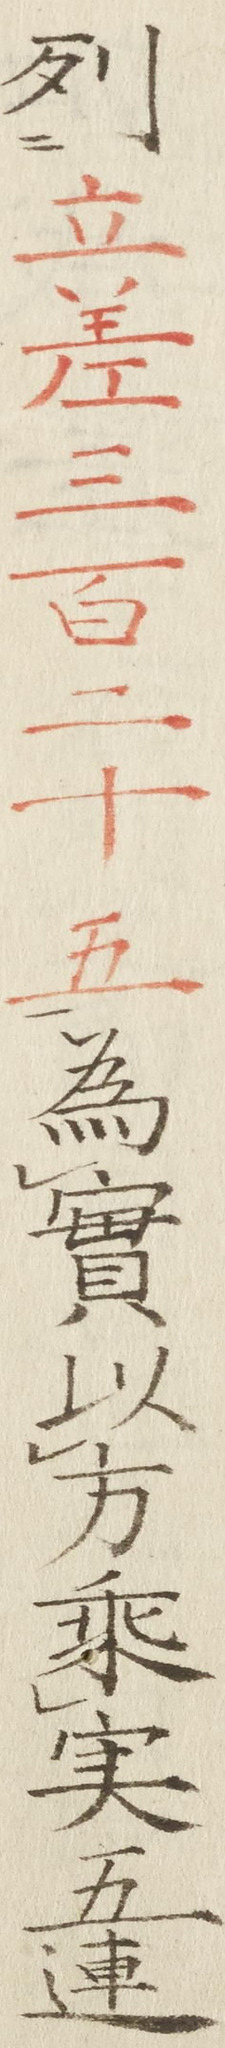列ニ立差三百二十五為実以方乗実五連
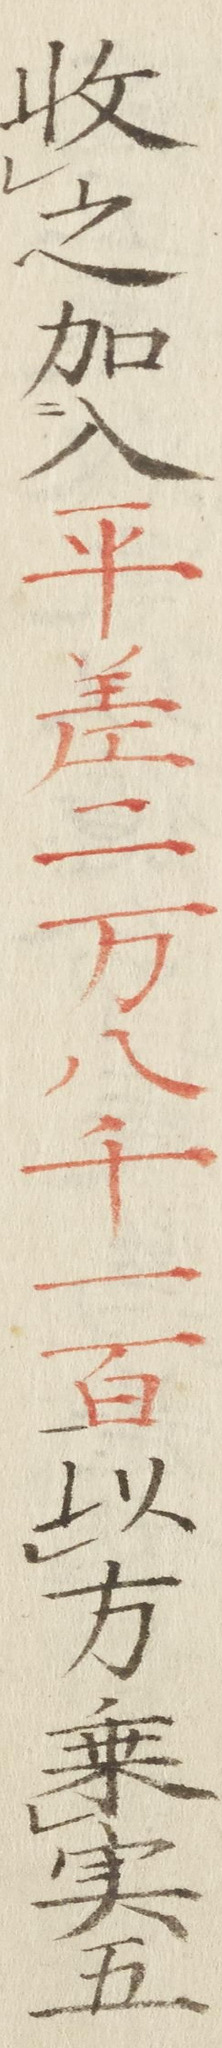収之加ニ入平差二万八千一百以方乗実五
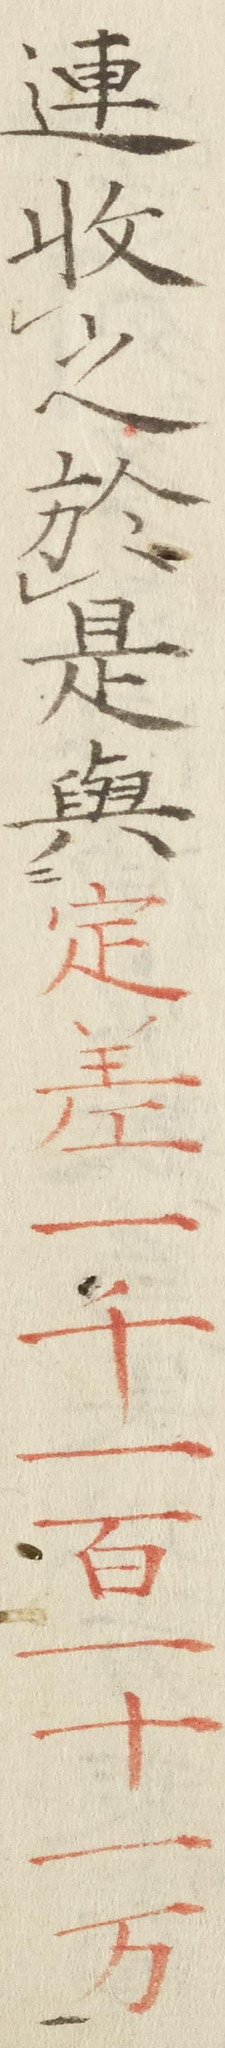連収之於是与ニ定差一千一百一十一万

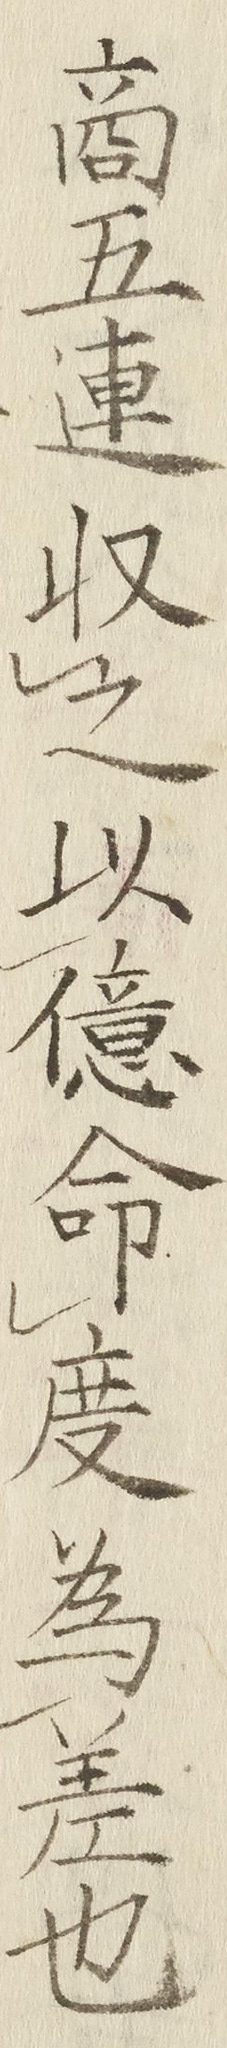商五連収之以億命度為差也
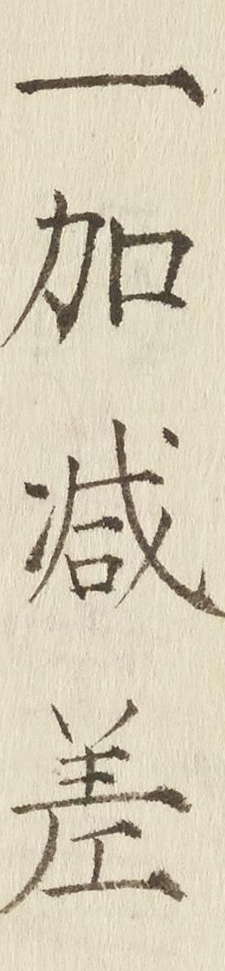一加減差
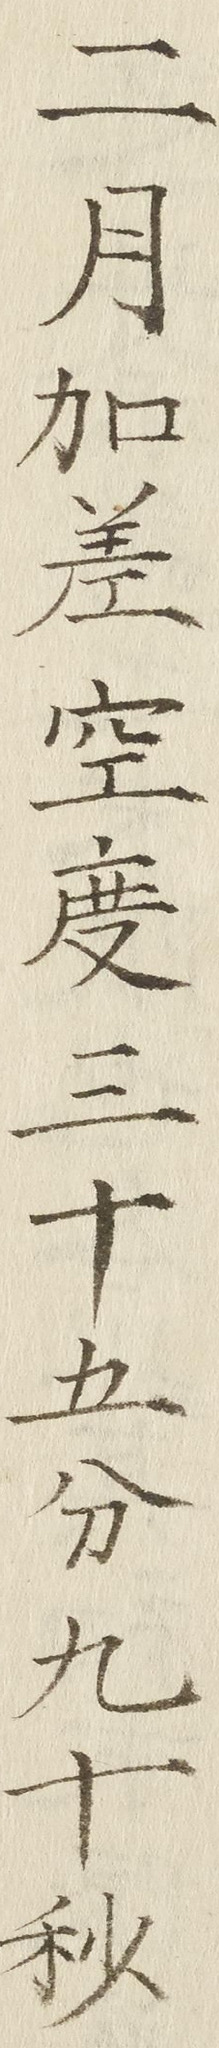二月加差空度三十五分九十秒
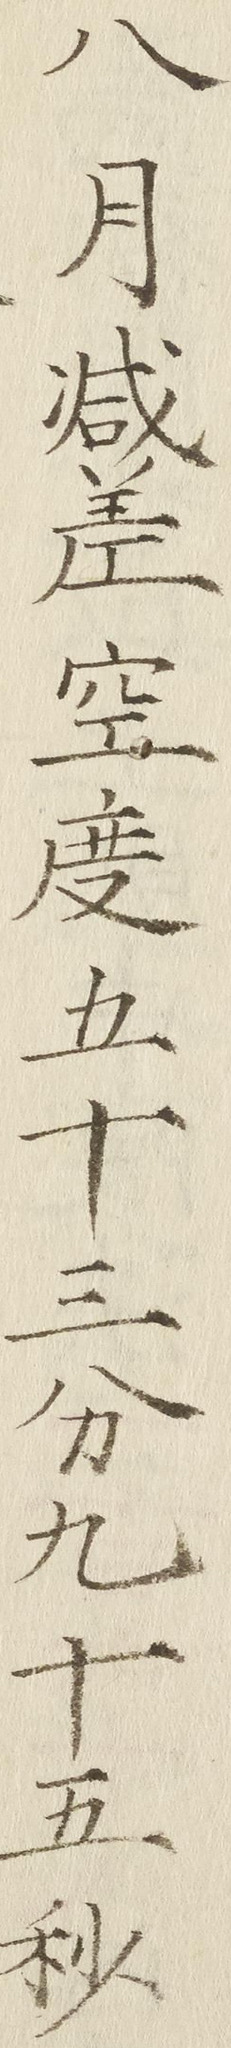八月減差空度五十三分九十五秒
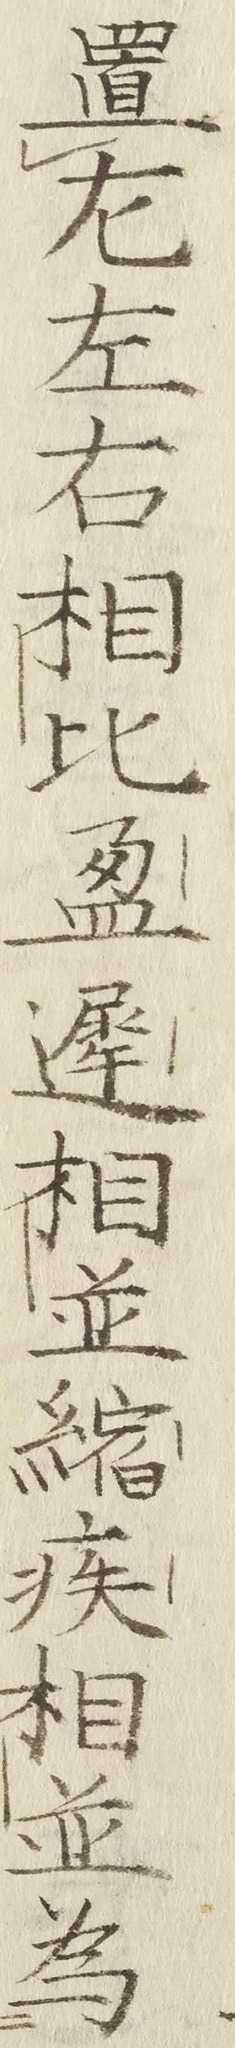置左左右相比盈遅相並縮疾相並為
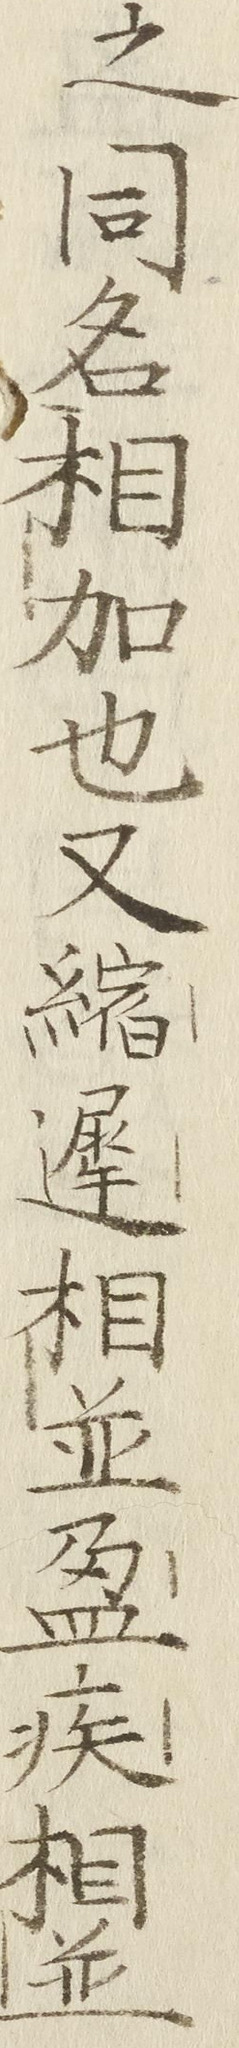之同名相加也又縮遅相並盈疾相並
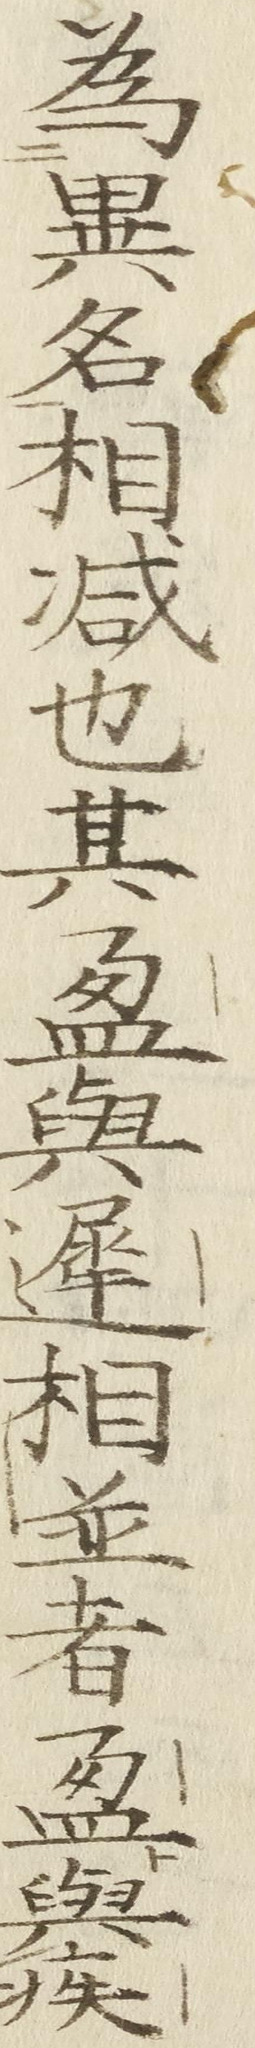為異名相減也其盈与遅相並者盈与疾
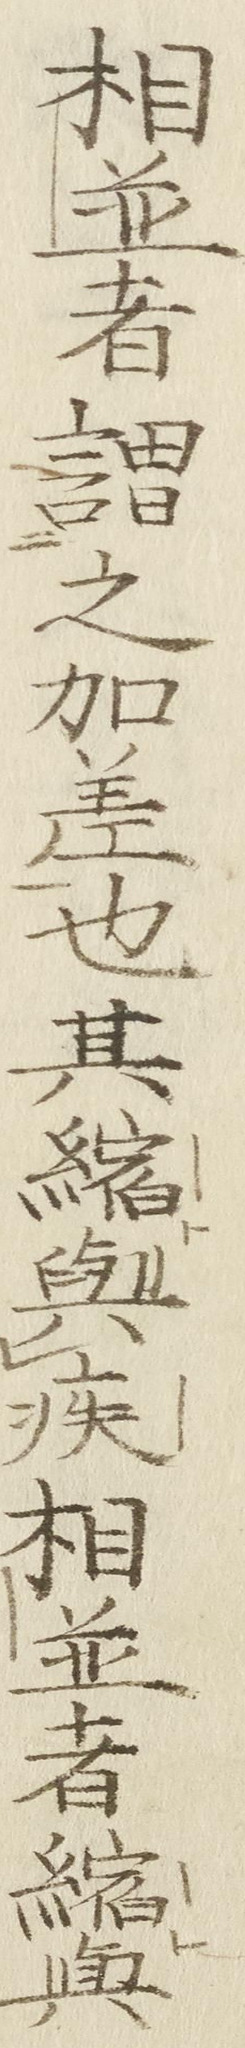相並者謂之加差也其縮与疾相並者縮与
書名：日食度
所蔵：東京大学地震研究所図書室 Earthquake Research Institute Library, The University of Tokyo, JAPAN
